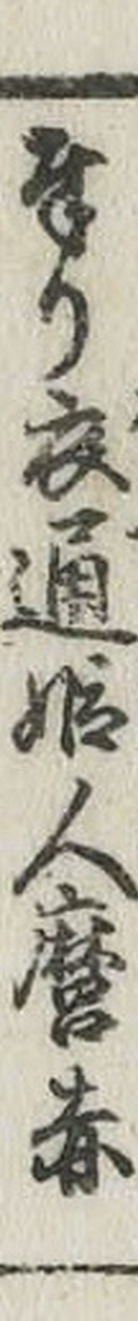奉り衣通姫人麿赤
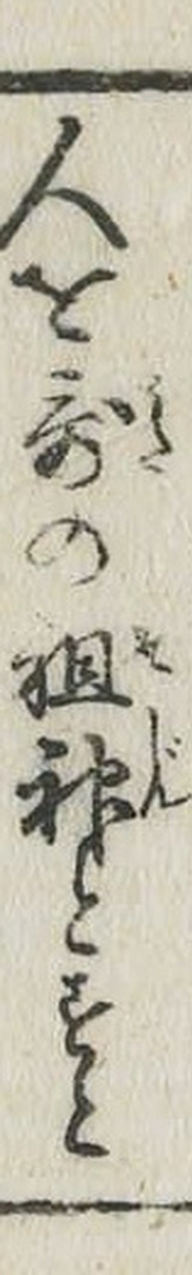人を哥の祖神とすと
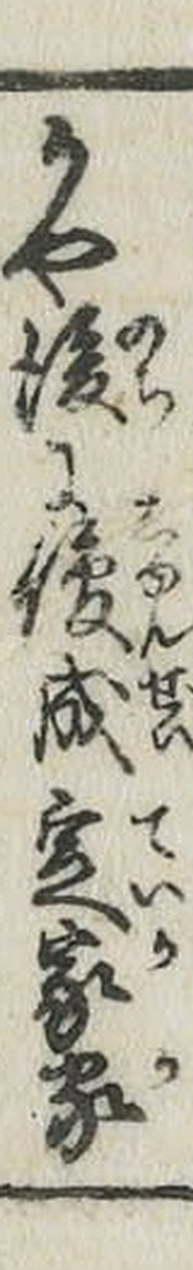かや後に俊成定家家
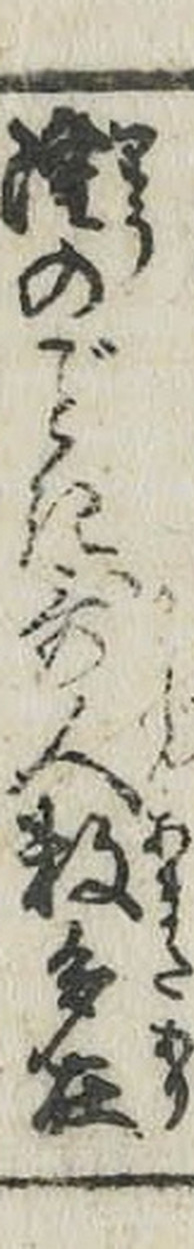隆のごとき哥人数多在
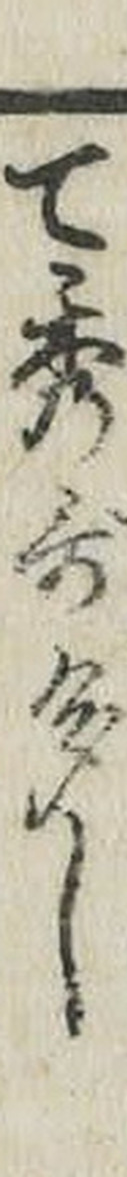て秀哥多し

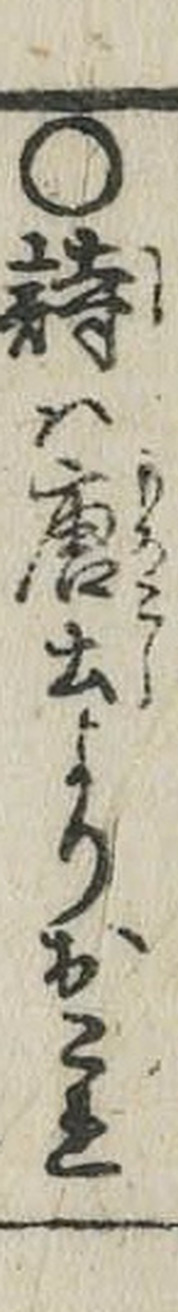○詩は唐土よりおこれ
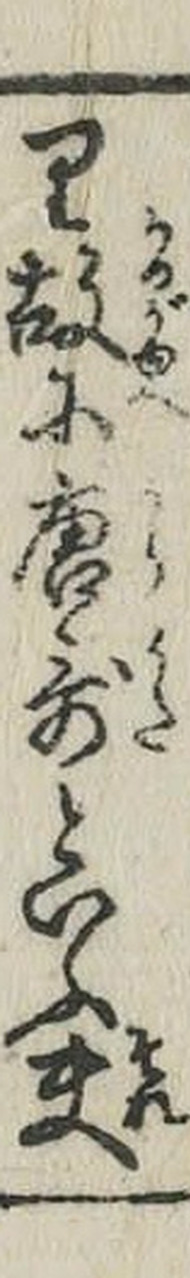り故に唐哥といふ夫
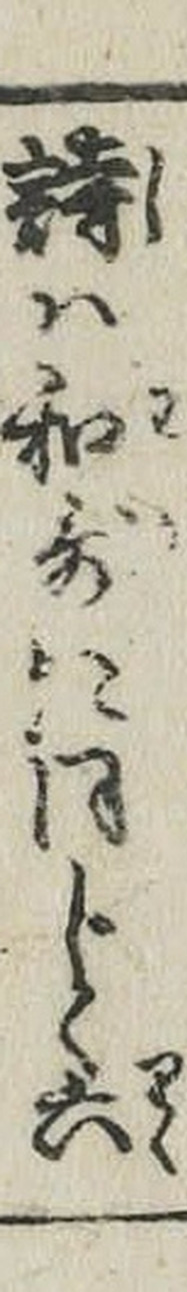詩は和哥に同じく六
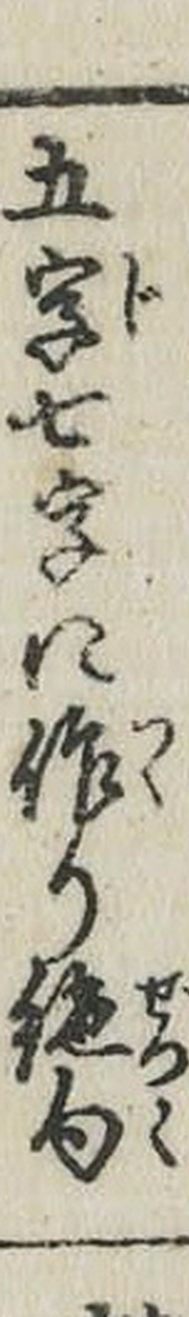五字七字に作り絶句
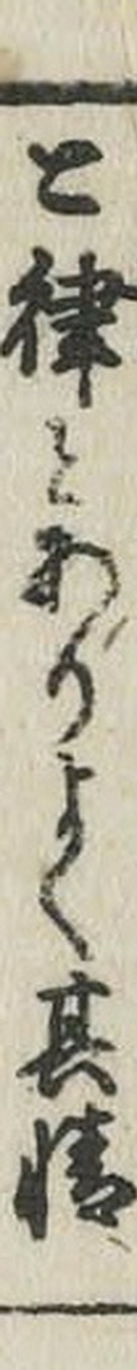と律とありよく其情
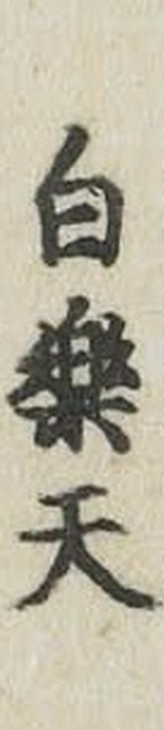白楽天
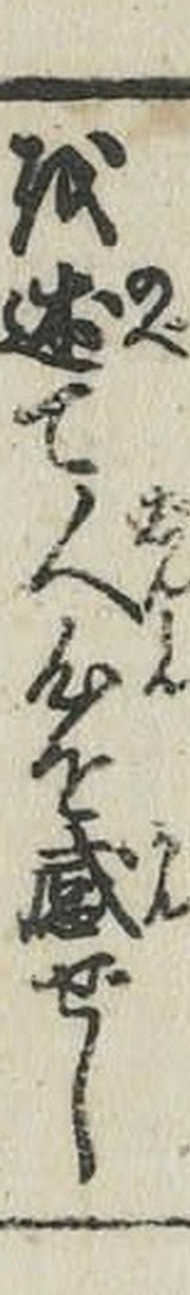を述て人心を感ぜし
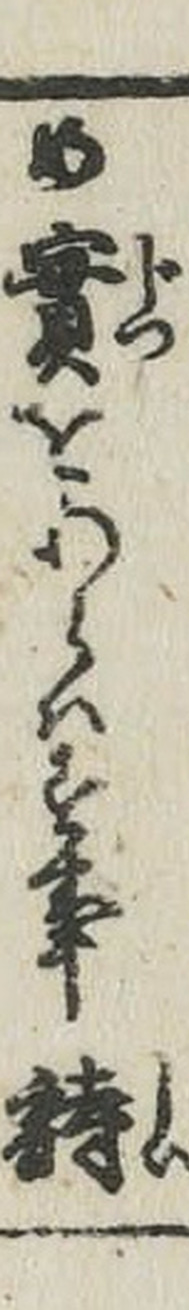め実をあらはす事詩
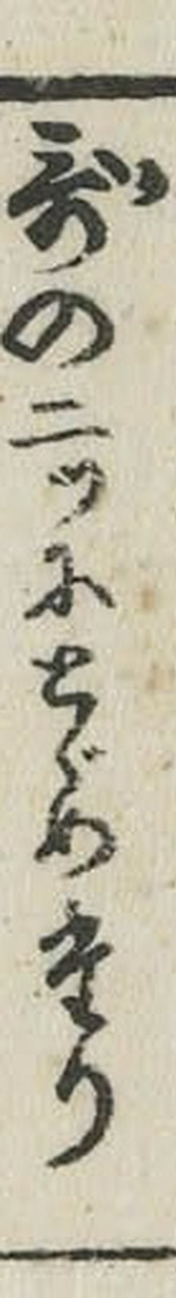哥の二ツにとゞめたり
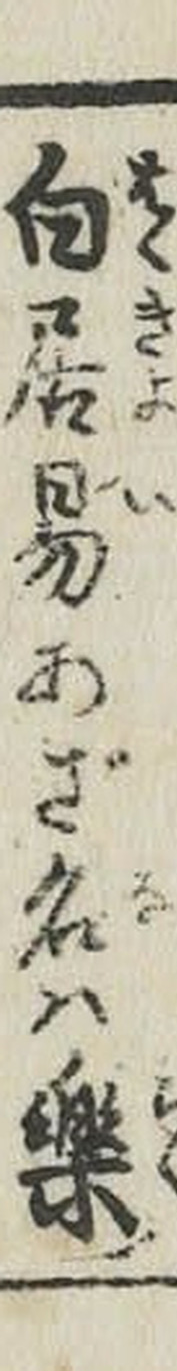白居易のあざ名は楽
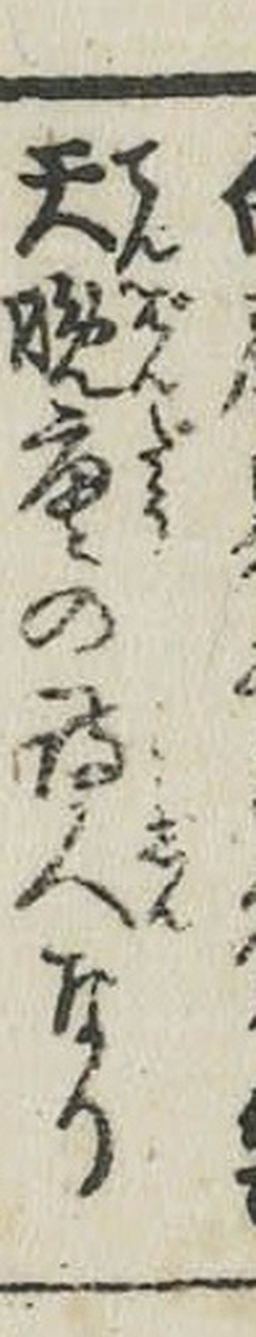天晩唐の詩人なり
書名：増補頭書訓蒙図彙大成 10巻 10:巻之21
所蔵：東京学芸大学教育コンテンツアーカイブ
